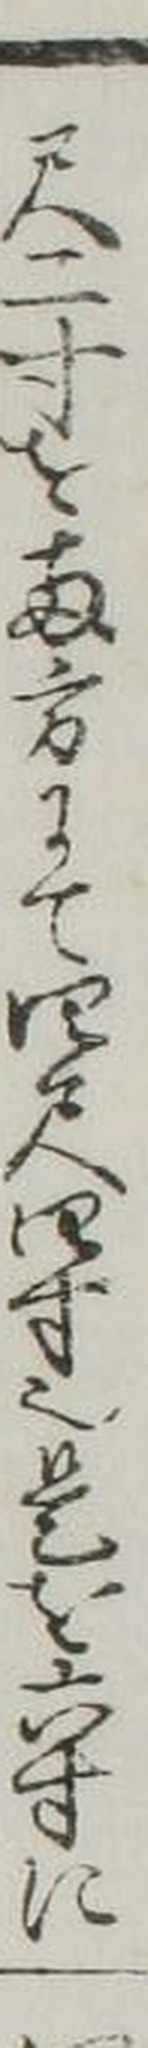尺二寸を両方にて四尺四寸也是を六寸に
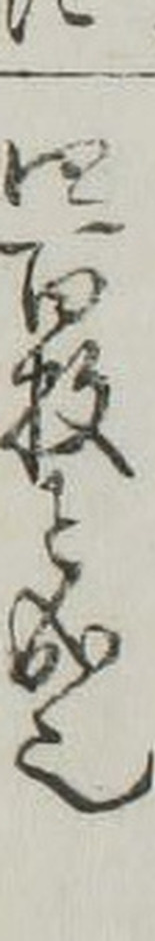四百枚と成也
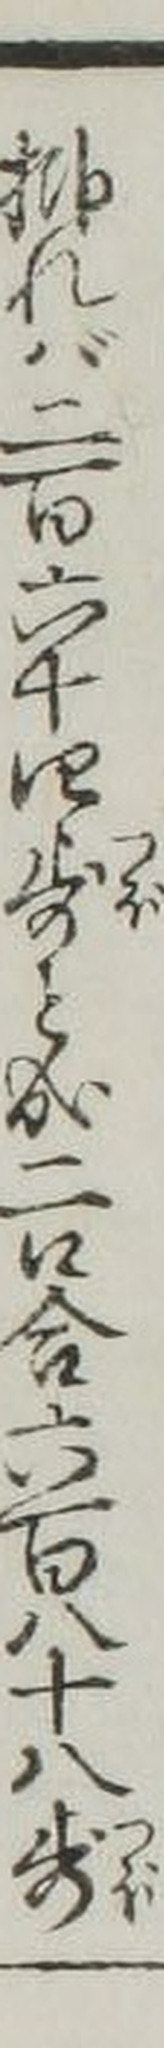掛れば二百六十四歩と成二口合六百八十八歩
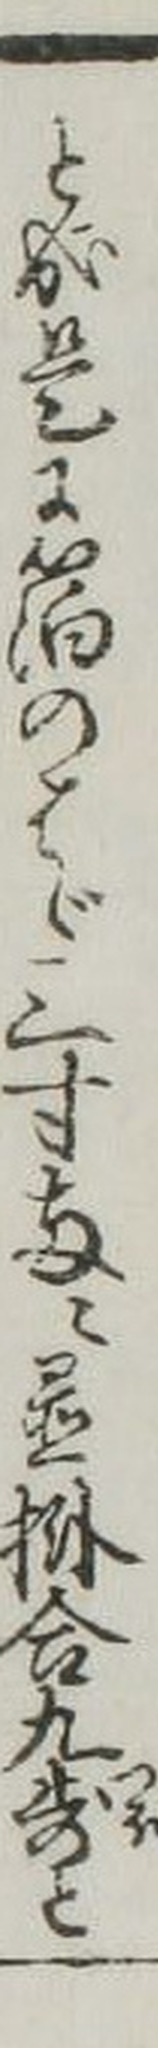と成是に箔のはゞ三寸両に置掛合九歩と
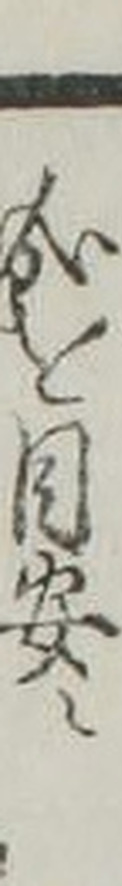成を目安に
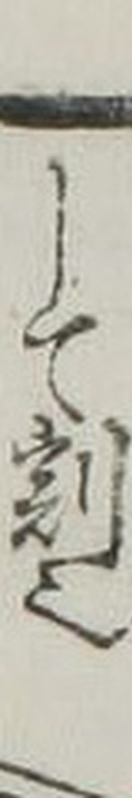して割也
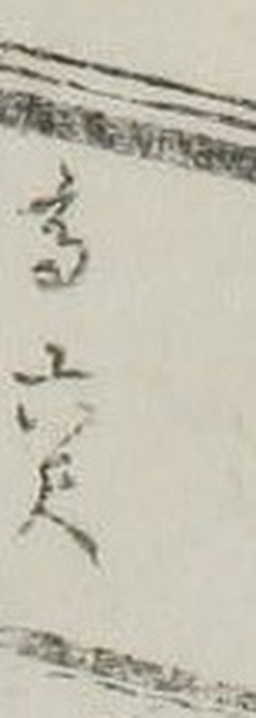高六尺
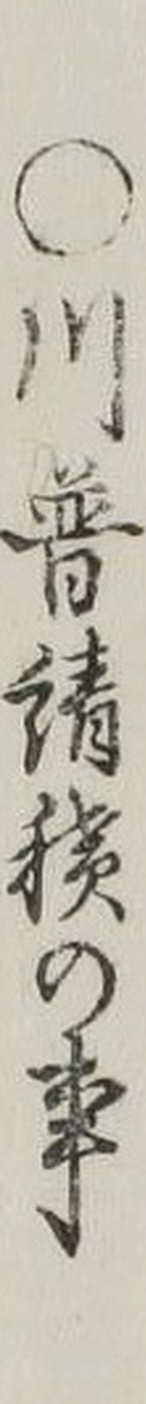○川普請積の事
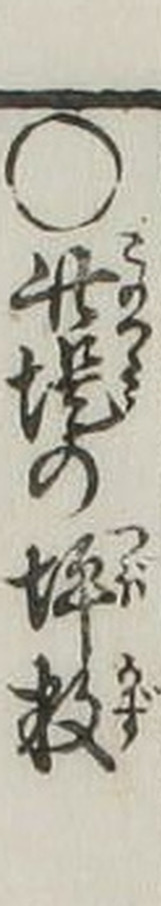○此堤の坪数
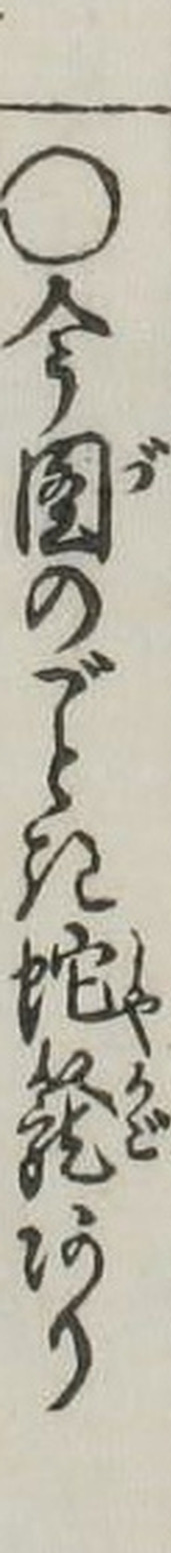○今図のごとき蛇籠あり
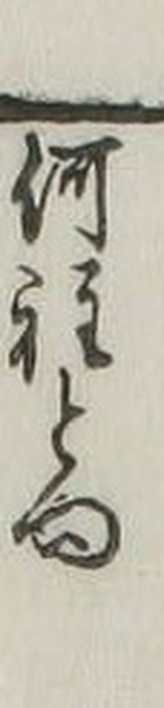何程と問
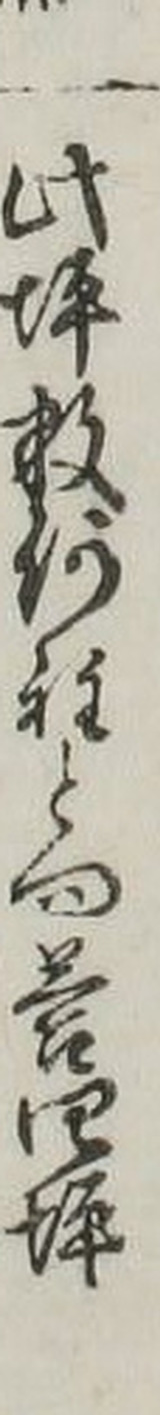此坪数何程と問答四坪
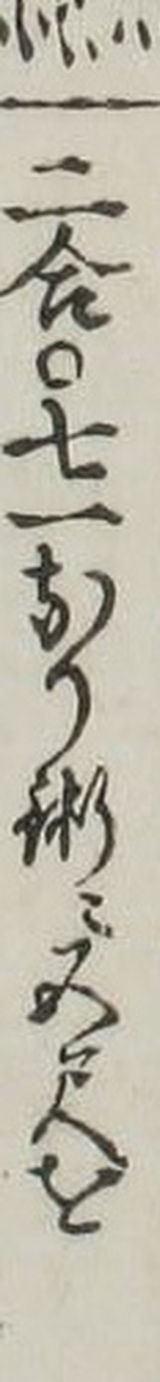二合〇七一なり術に五尺を
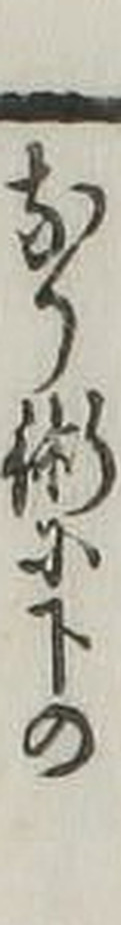なり術に下の
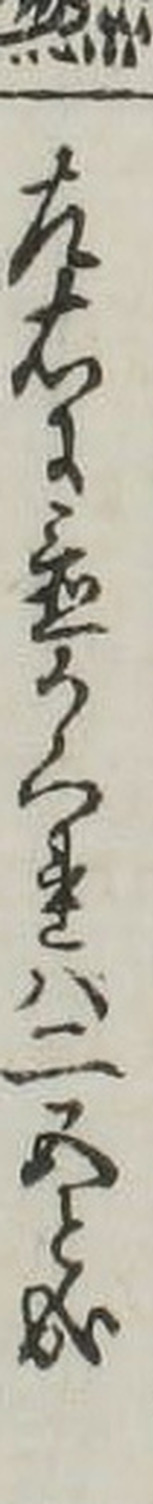左右に置かくれば二五と成
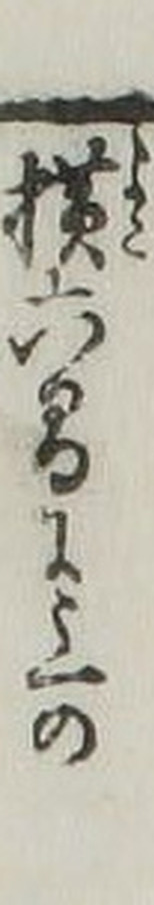横六間に上の
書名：宝玉塵劫記
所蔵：東京学芸大学教育コンテンツアーカイブ
